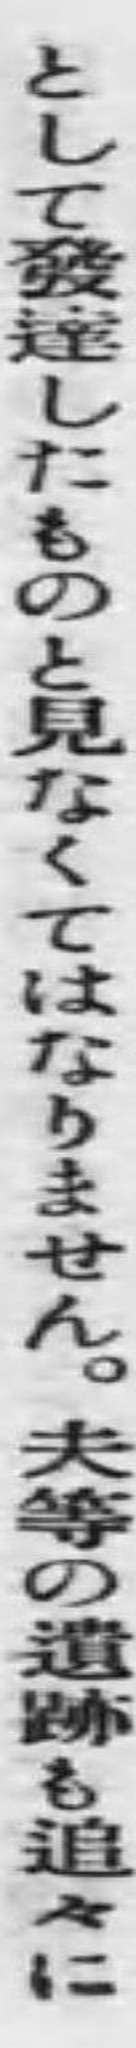として発達したものと見なくてはなりません。夫等の遺跡も追々に
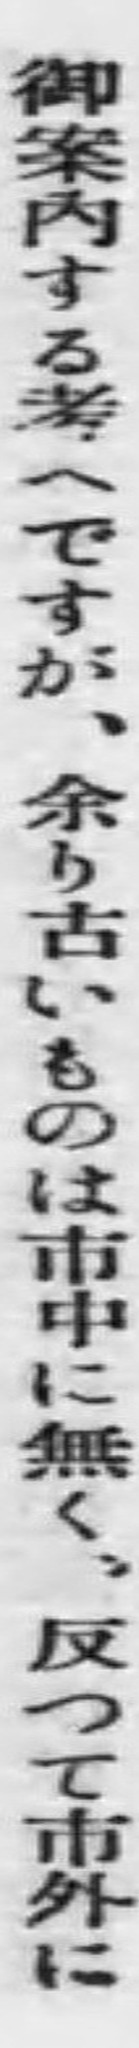御案内する考へですが、余り古いものは市中に無く、反つて市外に
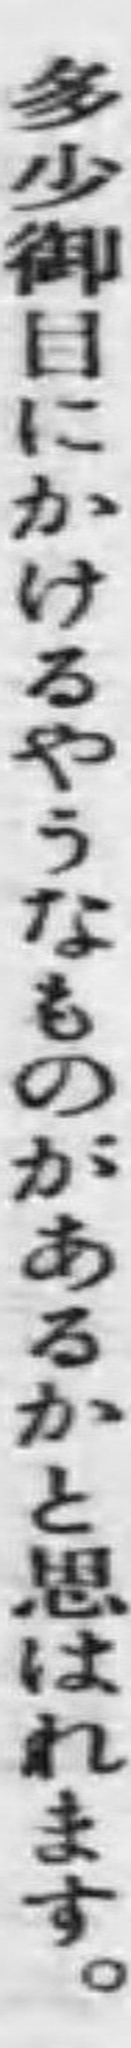多少御目にかけるやうなものがあるかと思はれます。
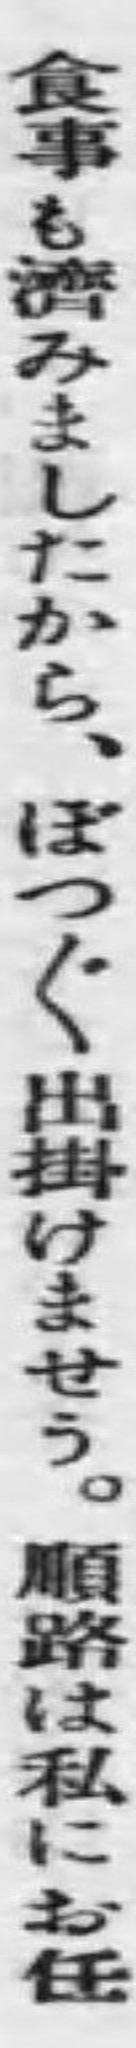食事も済みましたから、ぼつ〴〵出掛けませう。順路は私にお任
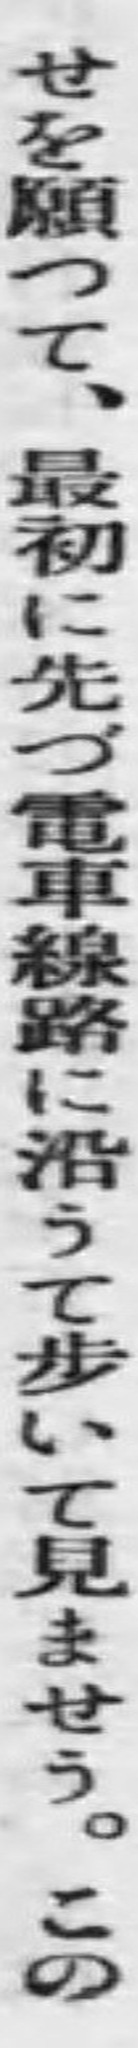せを願つて、最初に先づ電車線路に沿うて歩いて見ませう。この
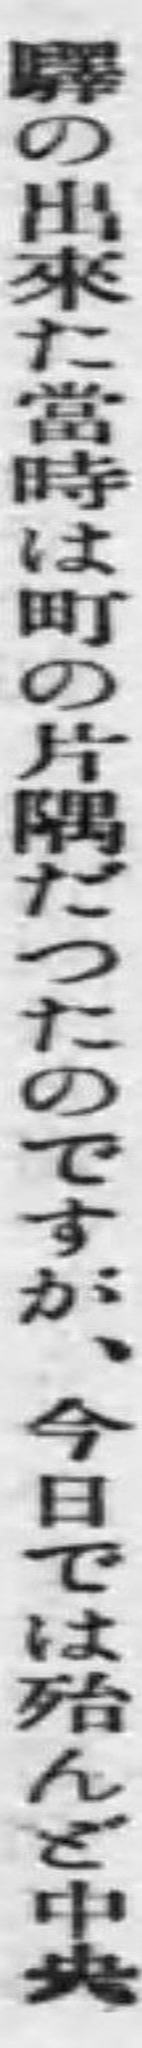駅の出来た当時は町の片隅だつたのですが、今日では殆んど中央
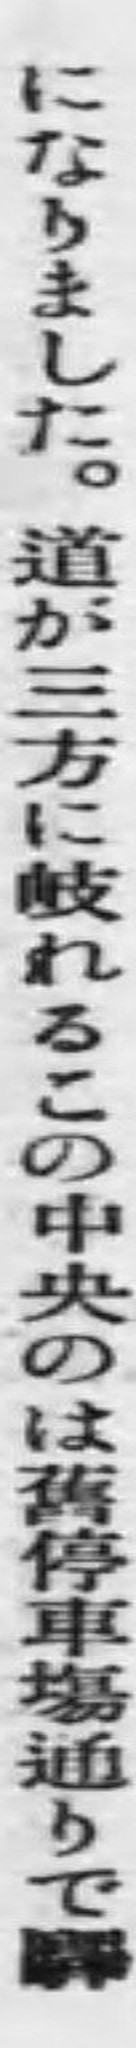になりました。道が三方に岐れるこの中央のは旧停車場通りで駅
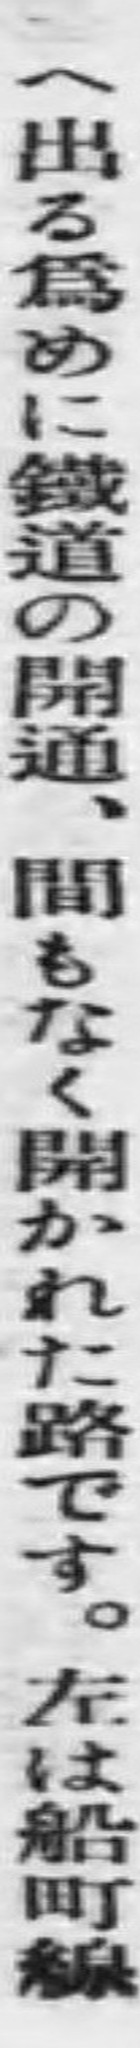へ出る為めに鉄道の開通、間もなく開かれた路です。左は船町線
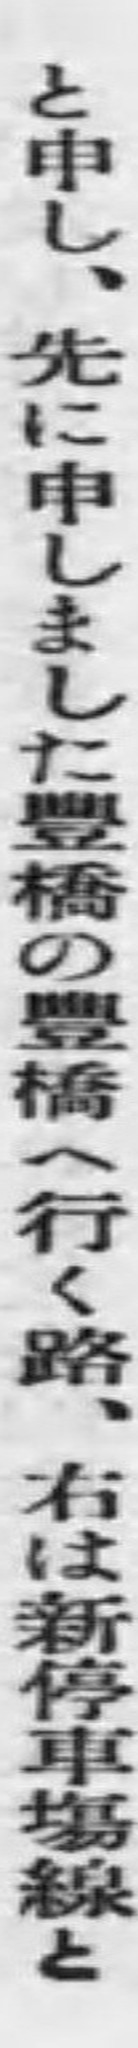と申し、先に申しました豊橋の豊橋へ行く路、右は新停車場線と
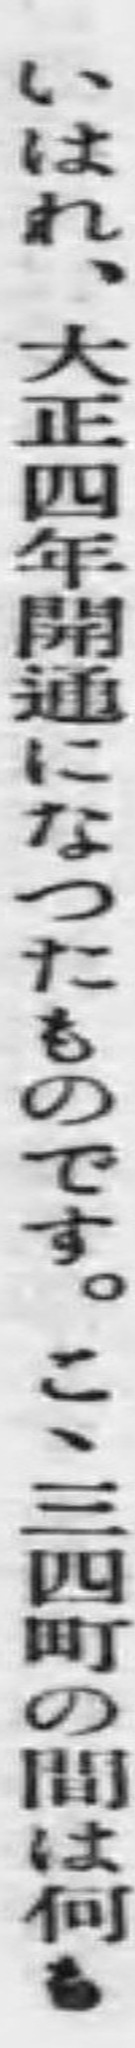いはれ、大正四年開通になつたものです。こゝ三四町の間は何も
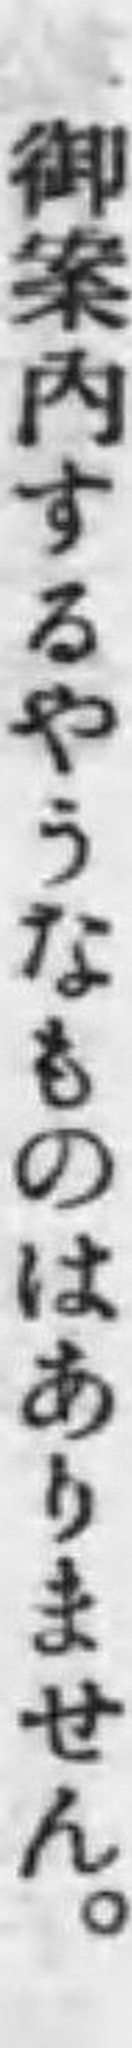御案内するやうなものはありません。

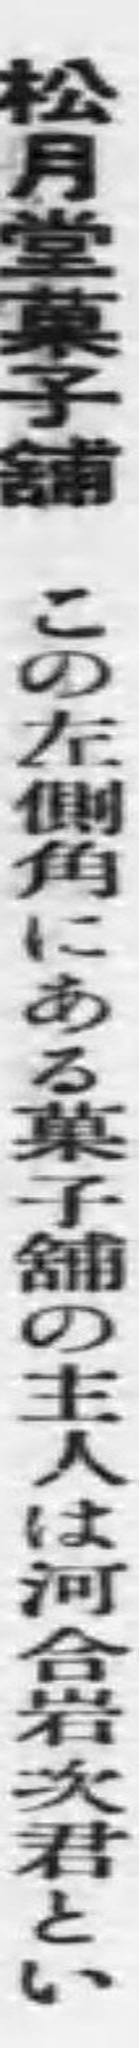松月堂菓子舗この左側角にある菓子舗の主人は河合岩次君とい
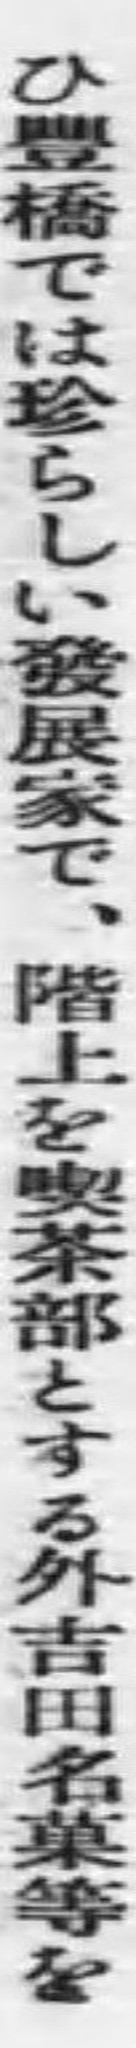ひ豊橋では珍らしい発展家で、階上を喫茶部とする外吉田名菓等を
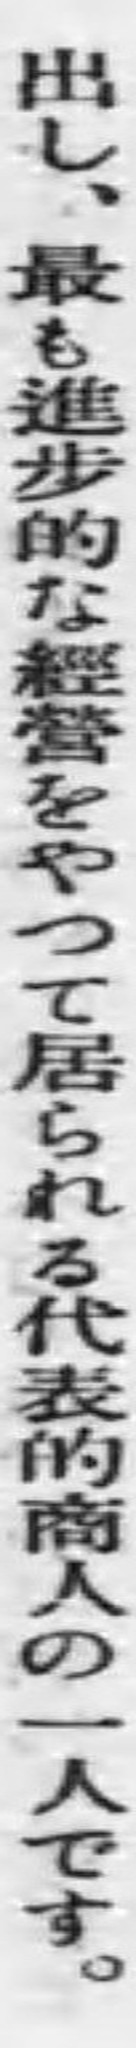出し、最も進歩的な経営をやつて居られる代表的商人の一人です。
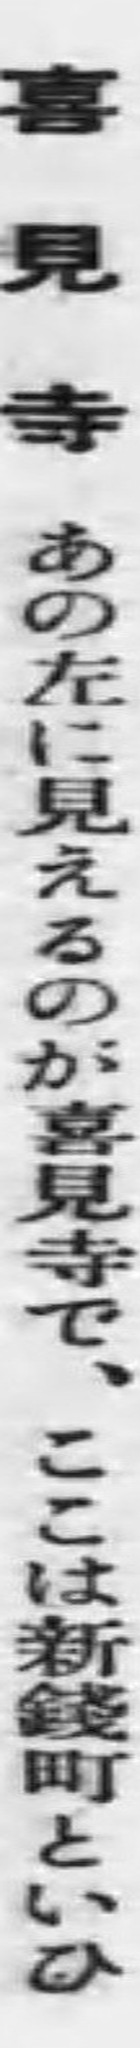喜見寺あの左に見えるのが喜見寺で、ここは新銭町といひ
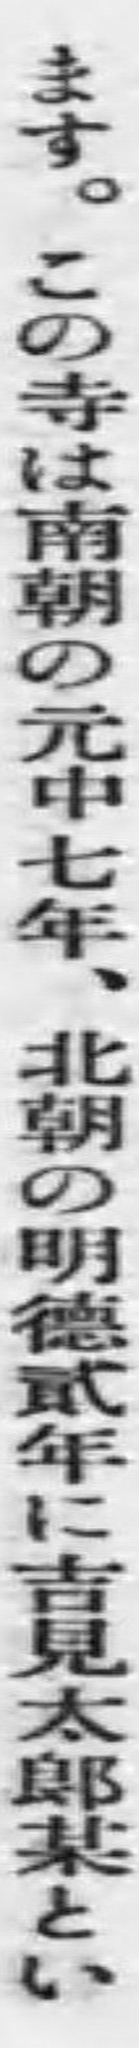ます。この寺は南朝の元中七年、北朝の明徳弐年に吉見太郎某とい
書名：東三河道中記 : 豊橋市及其附近案内
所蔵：国立国会図書館 National Diet Library, JAPAN
